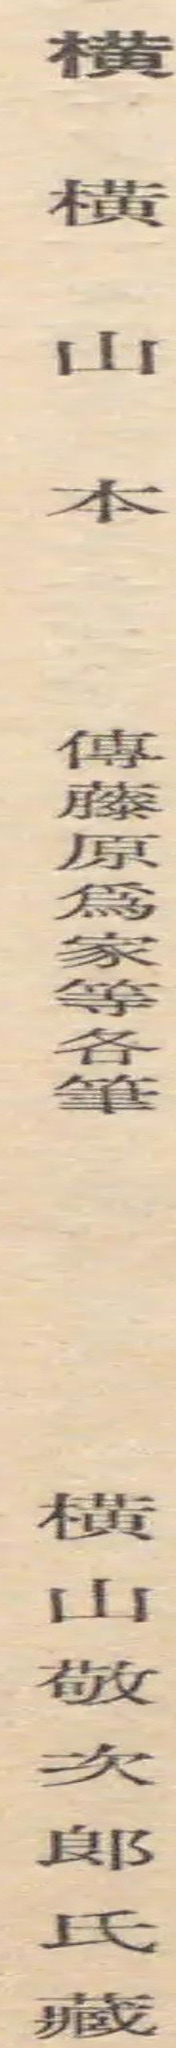横横山本伝藤原為家家等各筆横山敬次郎氏蔵
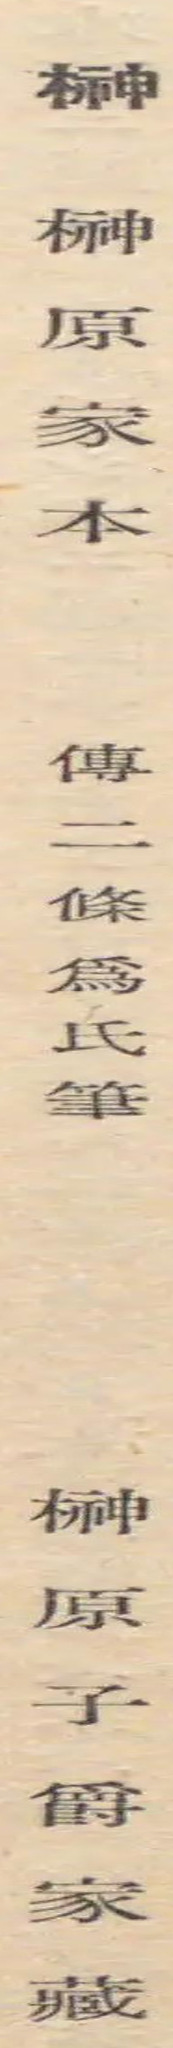榊榊原家本伝二条為氏筆榊原子爵家蔵
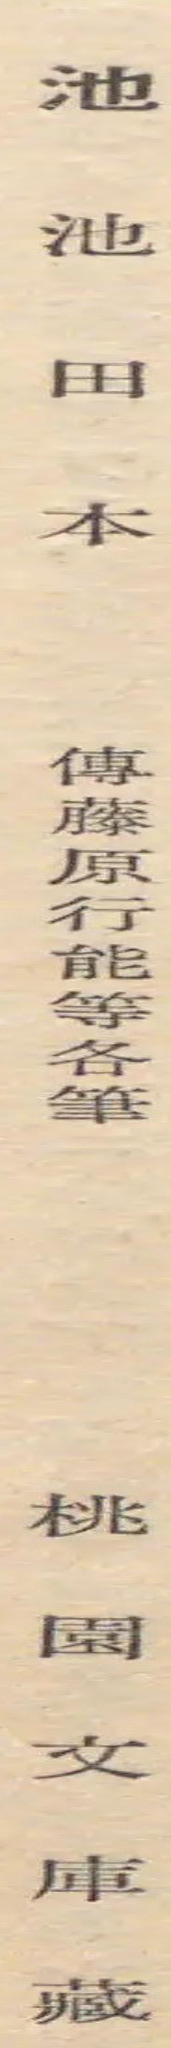池池田本伝藤原行惱等各筆桃園文庫蔵
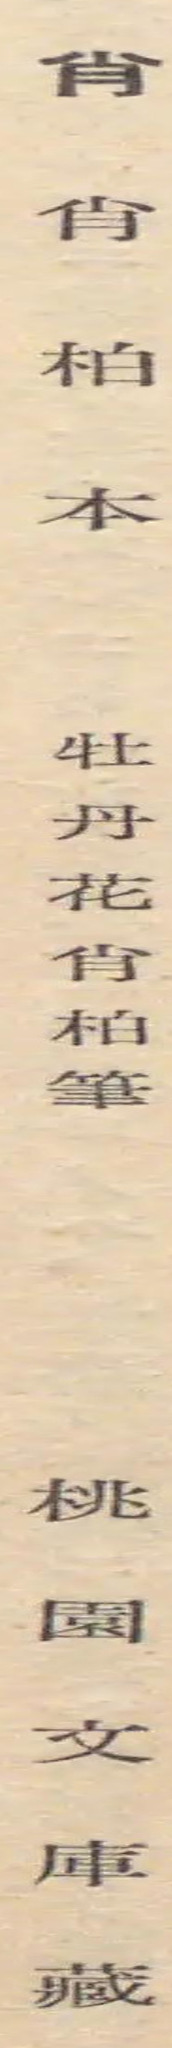肖肖柏本牡丹花肖柏筆桃園文庫蔵
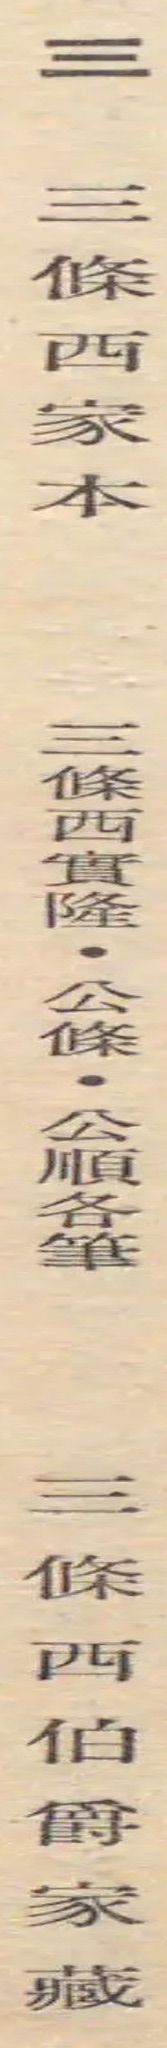三三条西家本三条西実隆・公条・公順各筆三条西伯爵家蔵
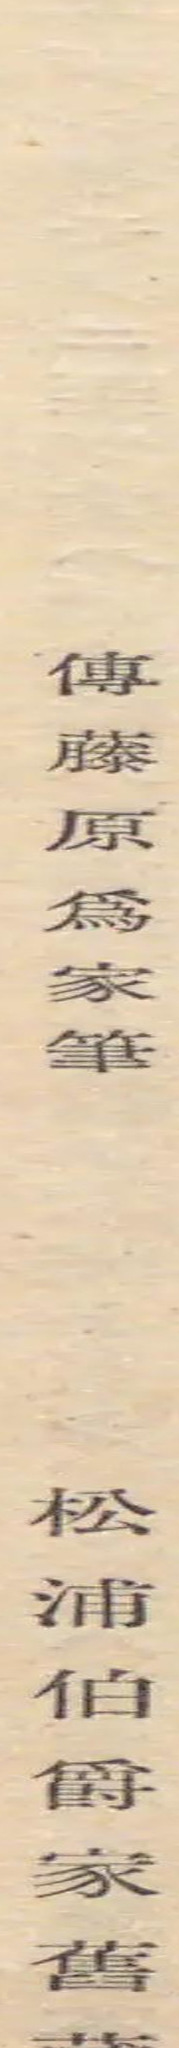松伝藤原為家筆松浦伯爵家旧蔵
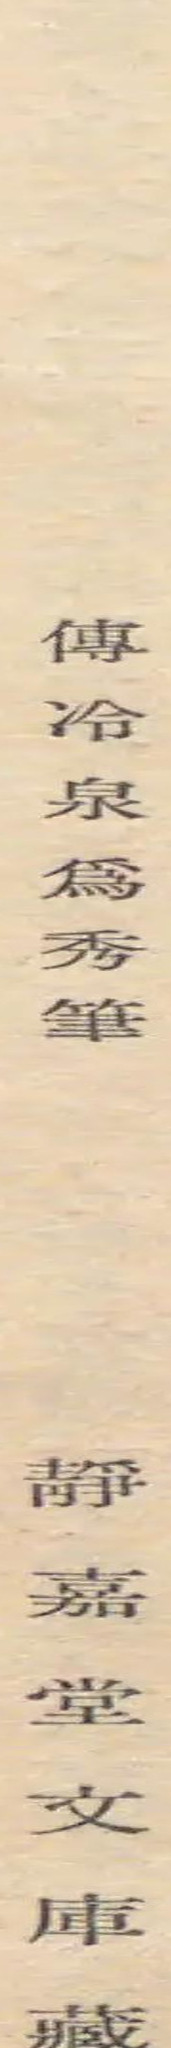秀伝冷泉為秀筆静嘉堂文庫蔵
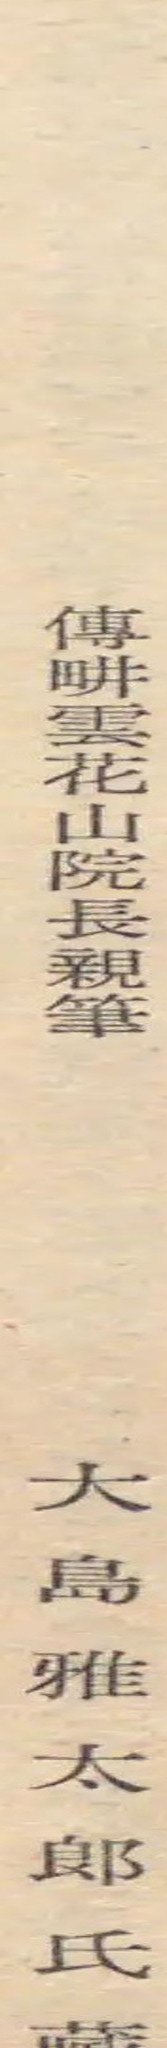長伝畊雲花山院長親筆大島雅太郎氏蔵
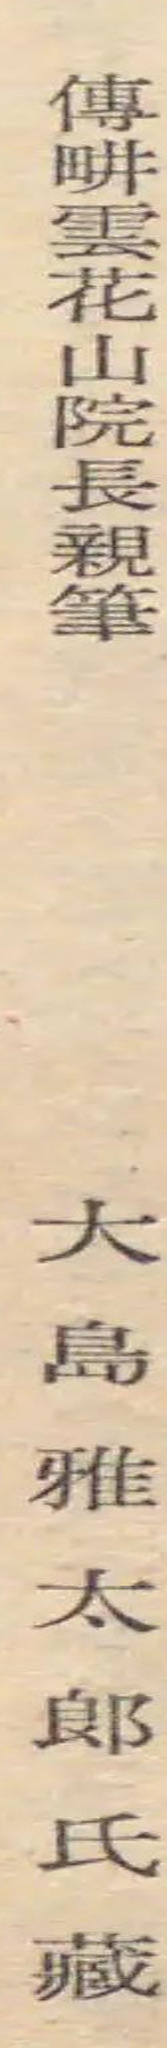長伝畊雲花山院長親筆大島雅太郎氏蔵
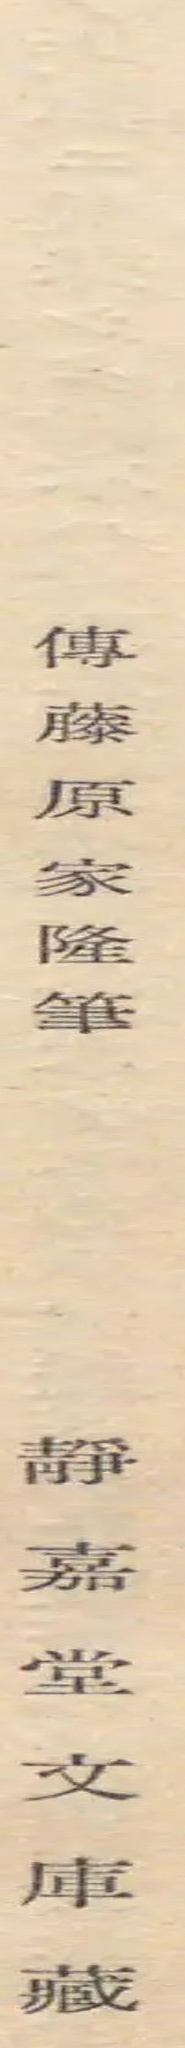家伝藤原家隆筆静嘉堂文庫蔵
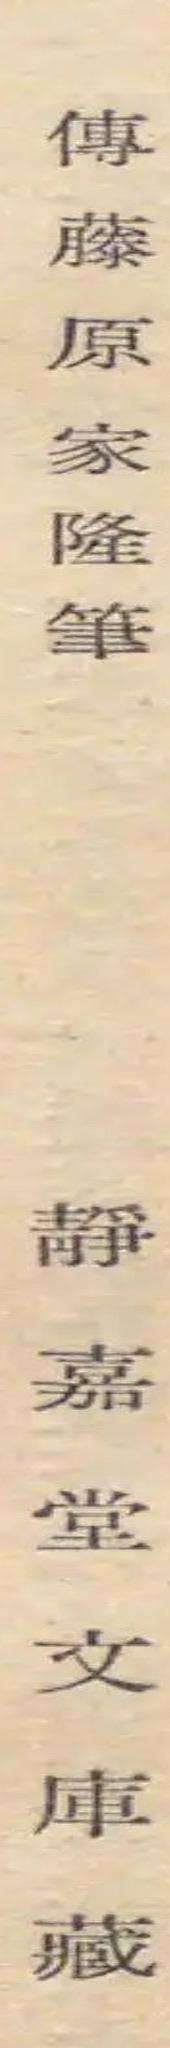家伝藤原家隆筆静嘉堂文庫蔵
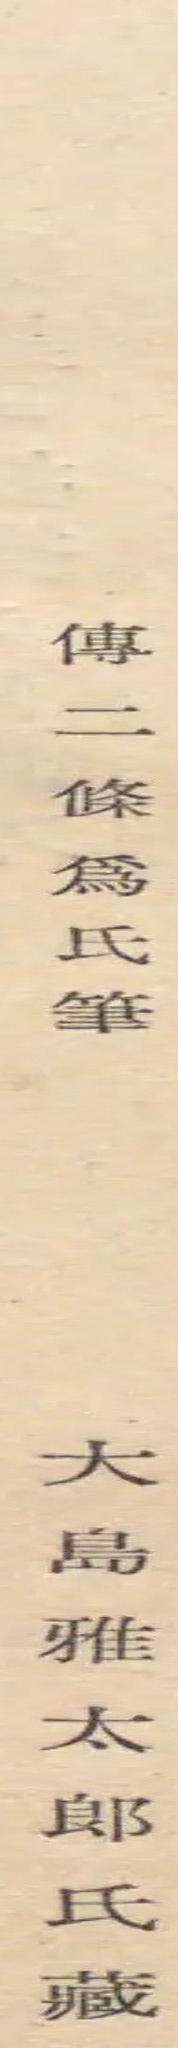氏伝二条為氏筆大島雅太郎氏蔵
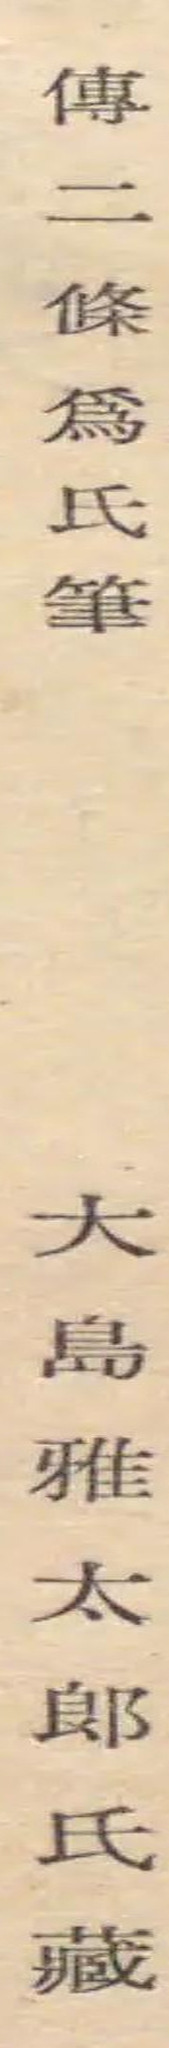氏伝二条為氏筆大島雅太郎氏蔵
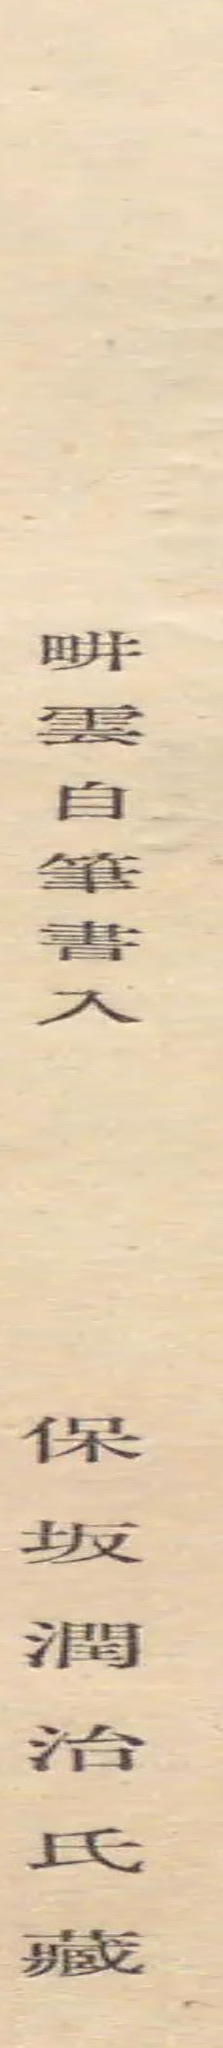畊畊雲自筆書入保坂潤治氏蔵
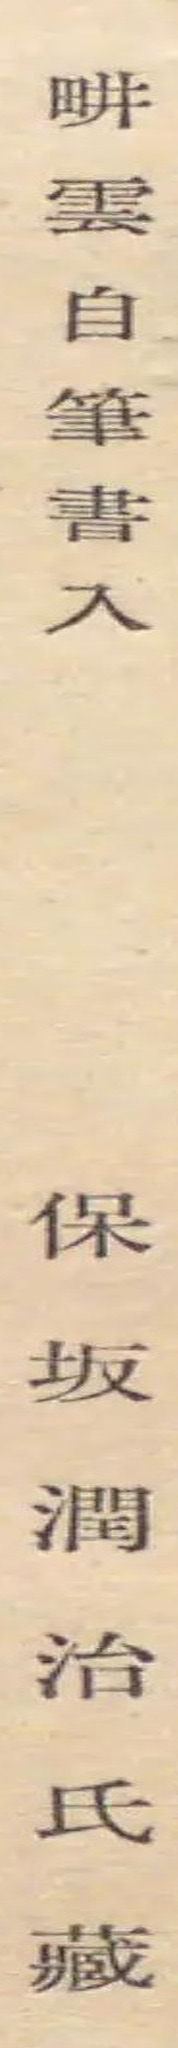畊畊雲自筆書入保坂潤治氏蔵
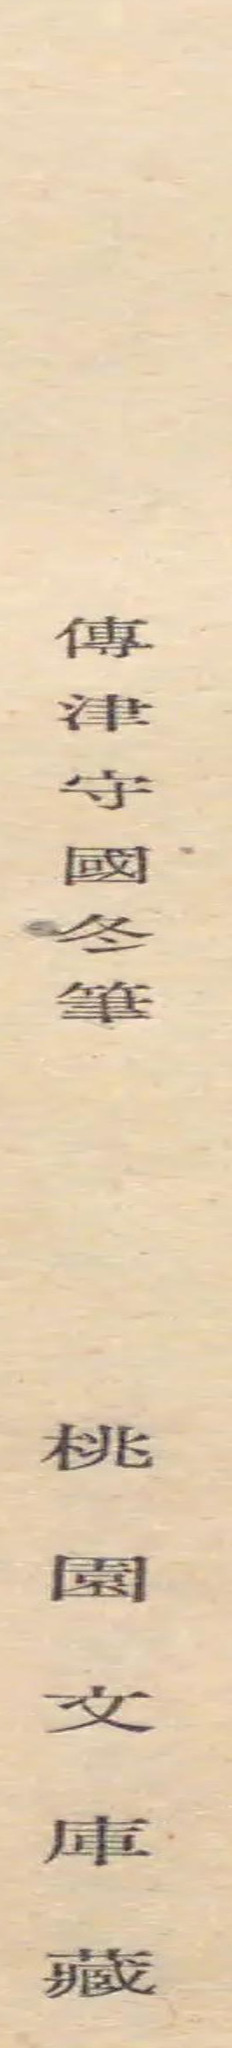冬伝津守国冬筆桃園文庫蔵
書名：校異源氏物語.
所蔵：国立国会図書館 National Diet Library, JAPAN
